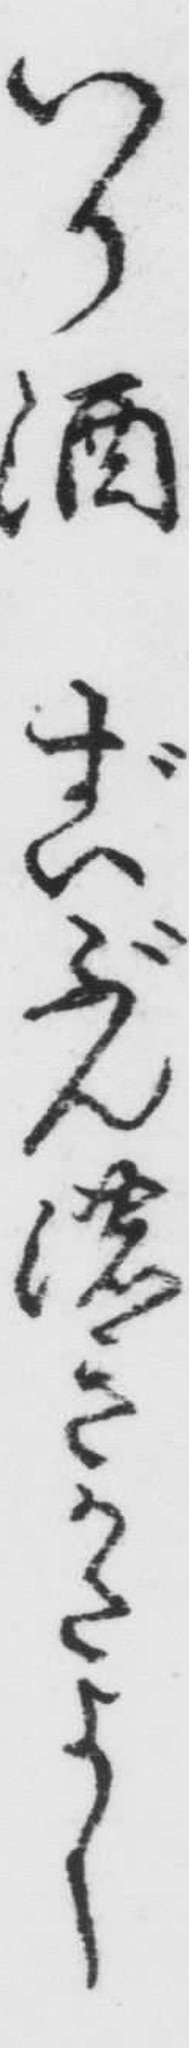いり酒ずいぶん濃きかたよし
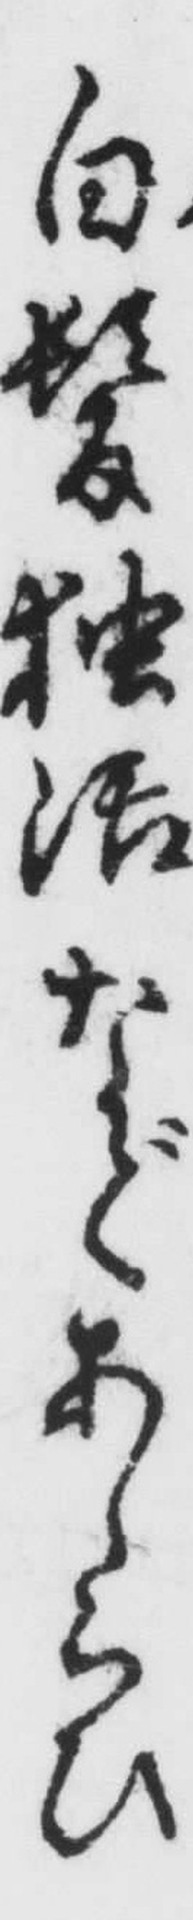白髪独活などあしらひ
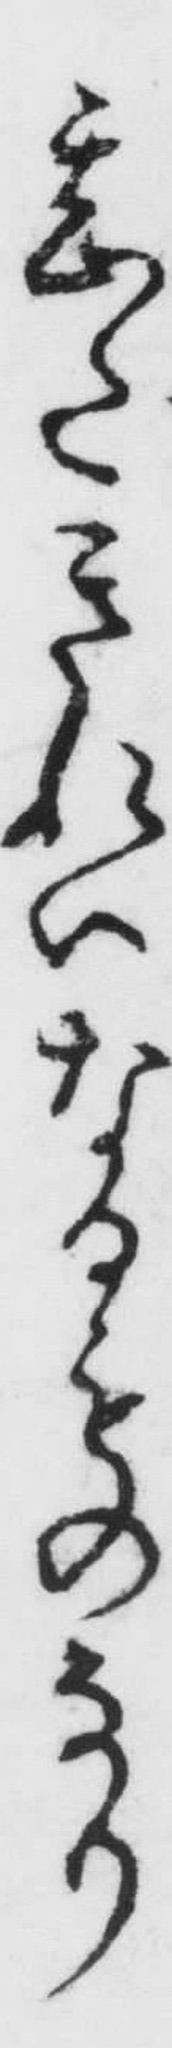甚だきれいなるものなり

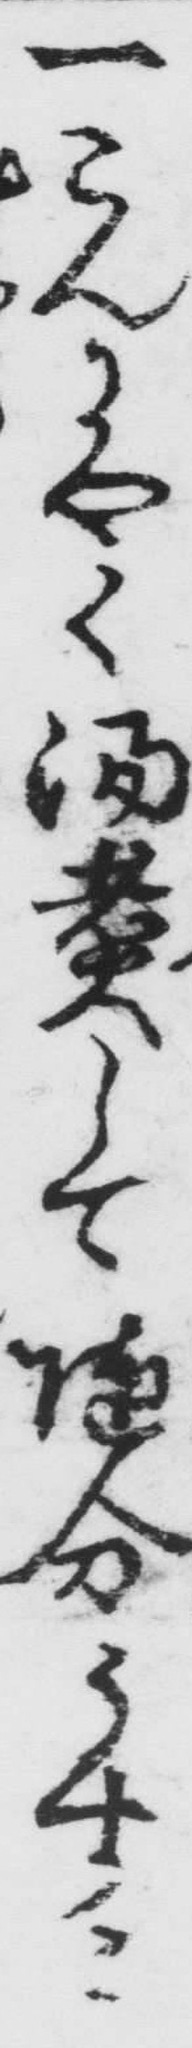一こんにやく湯煮して随分うすく
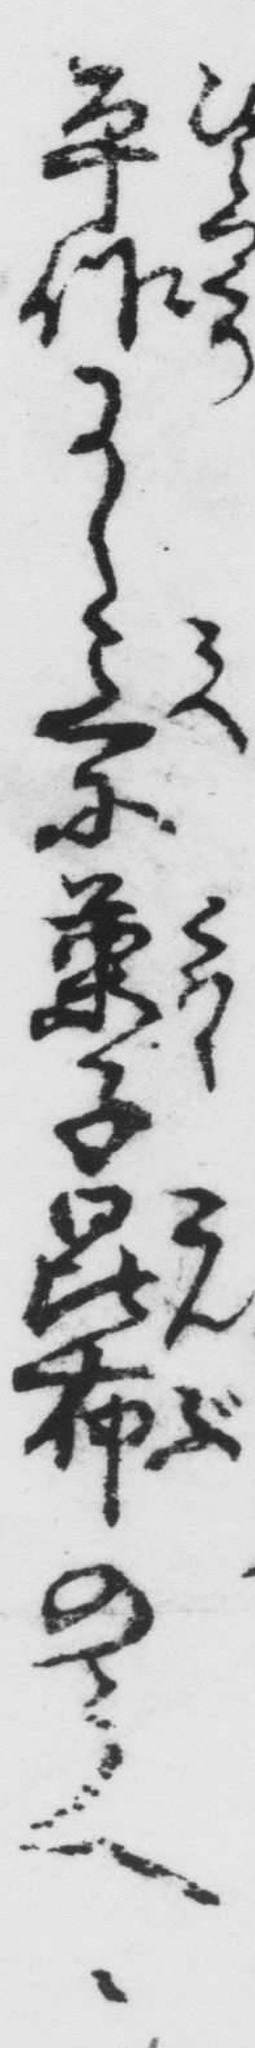平作にし上に菓子昆布のうへ
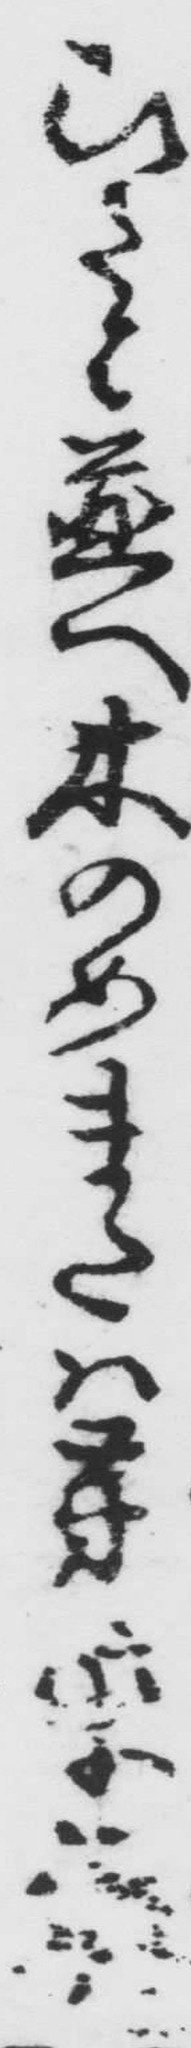ひたと並へ木のめまたは芽紫蘇
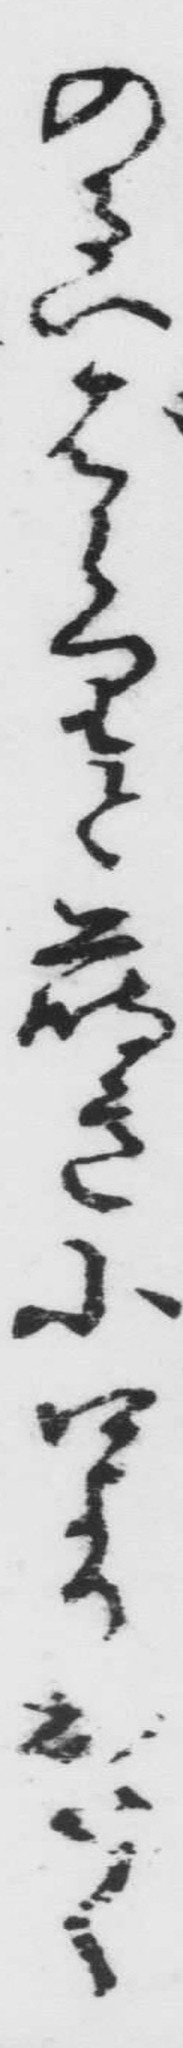のるいばらりと蒔き小口よりおい〳〵
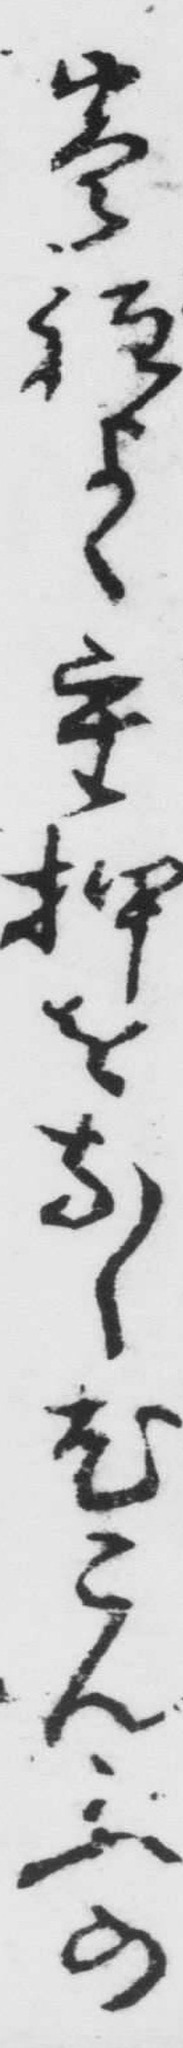巻程よく重押をおく尤こんふの
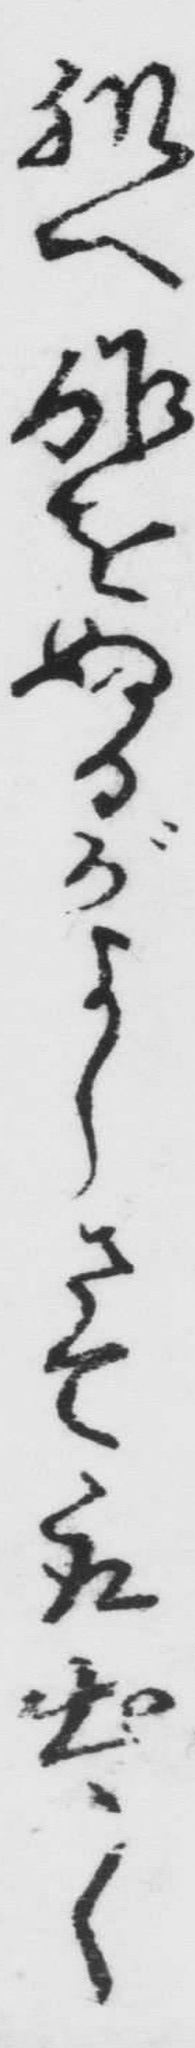肌へ酢をぬるがよしさて取出し
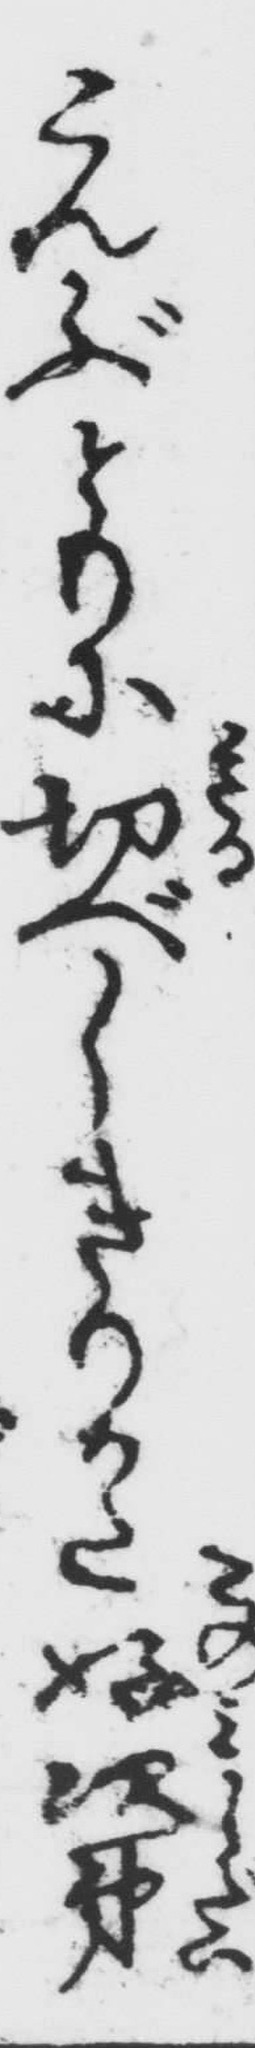こんぶともに切べしきりかた好次第
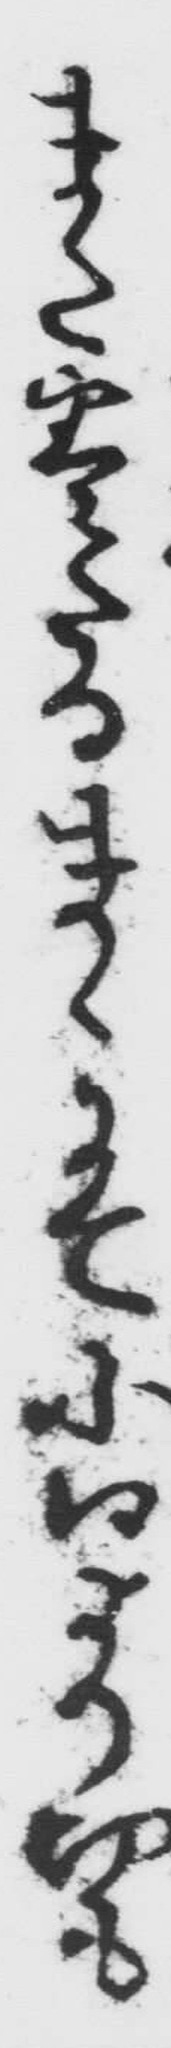また巻たるまゝにて小口より切も
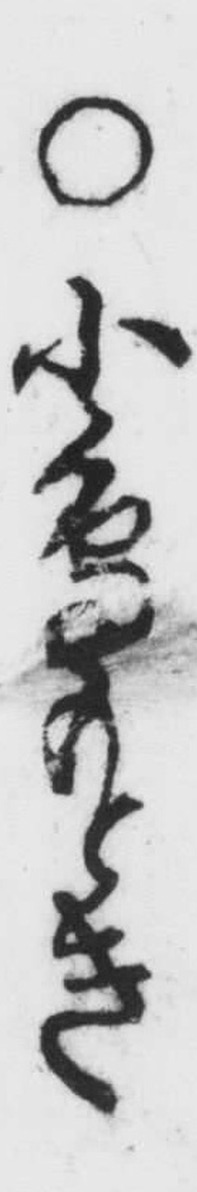○小鳥もとき
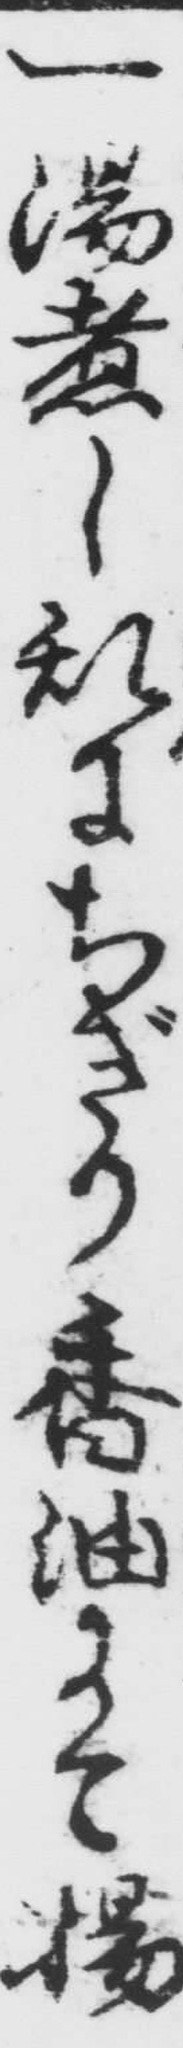一湯煮し乱にちぎり香油にて揚
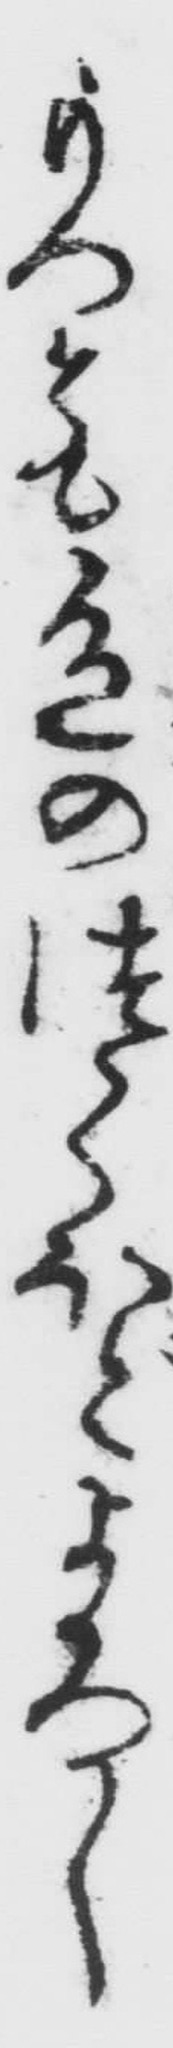もつとも色のづくほどよろし

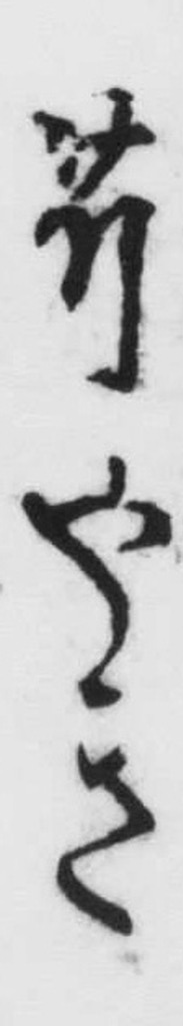芹やき
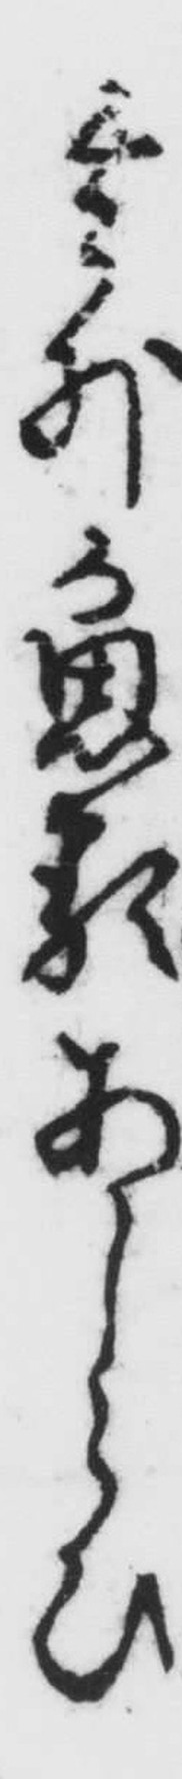其外魚類あしらひ
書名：蒟蒻百珍
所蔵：大阪府立大学学術情報センター 国文学研究資料館
